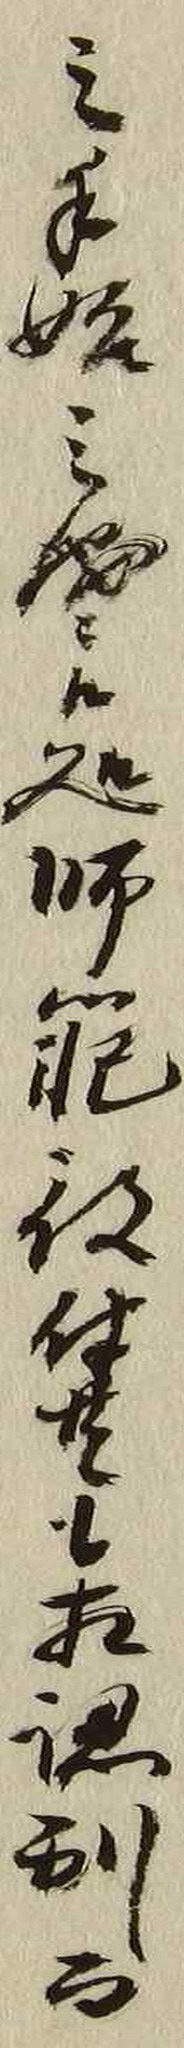之手始之儀ニ候処師範役付共も相認別而
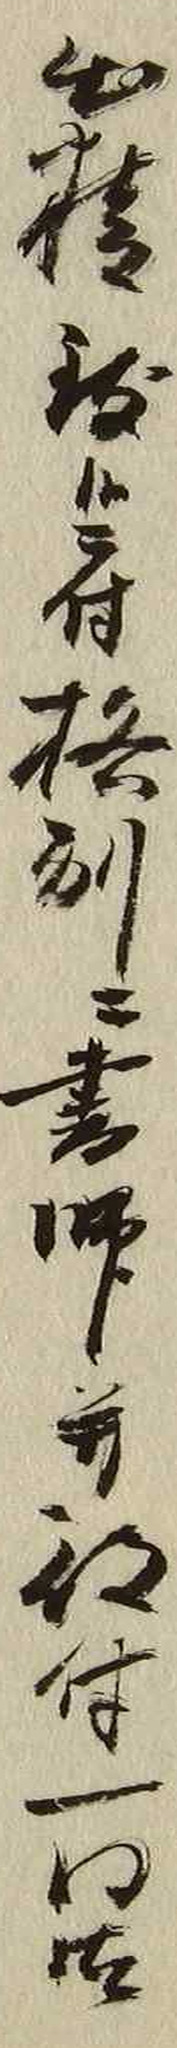出精致候ニ付格別ニ書師并役付一同御
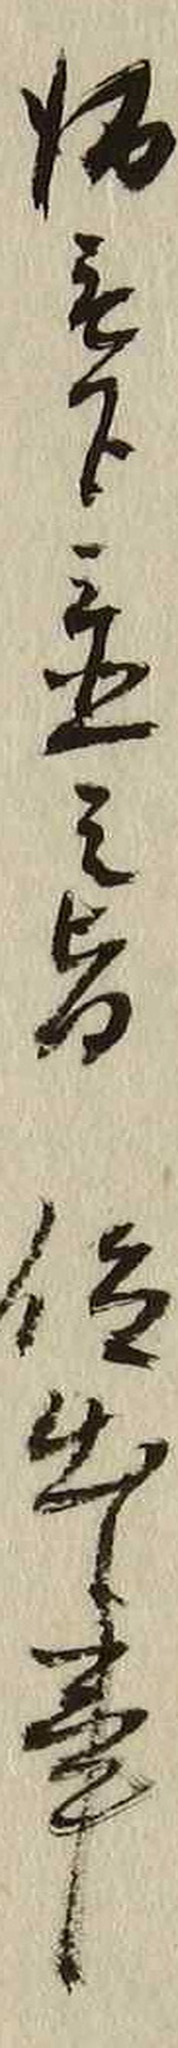酒被下置之旨仰出候事
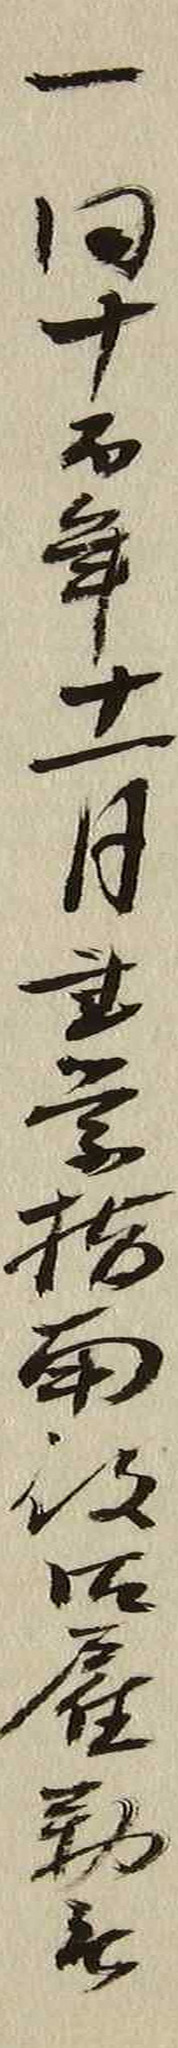一同十酉年十一月書学指南役御雇勤被
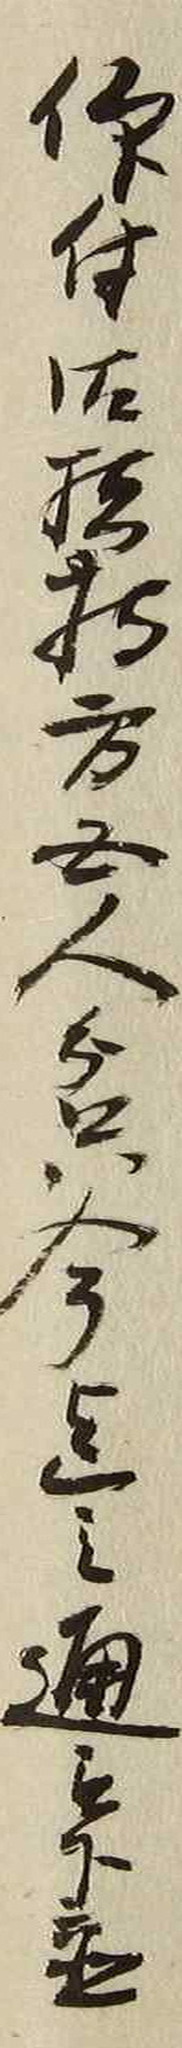仰付御扶持方五人分只今迄之通被下置
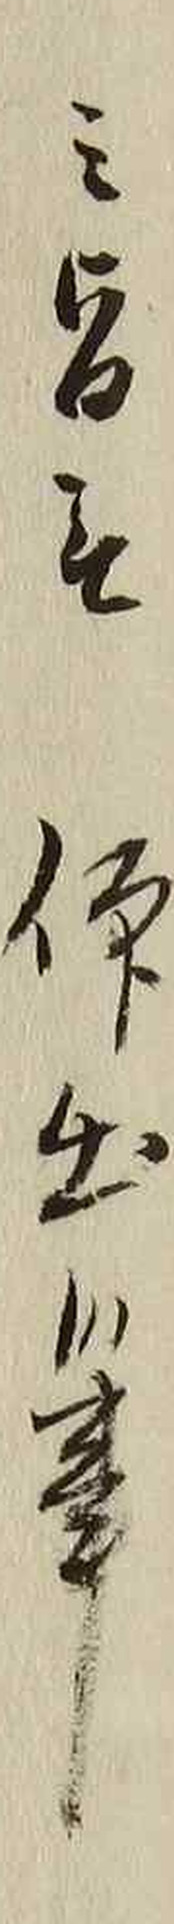之旨被仰出候事
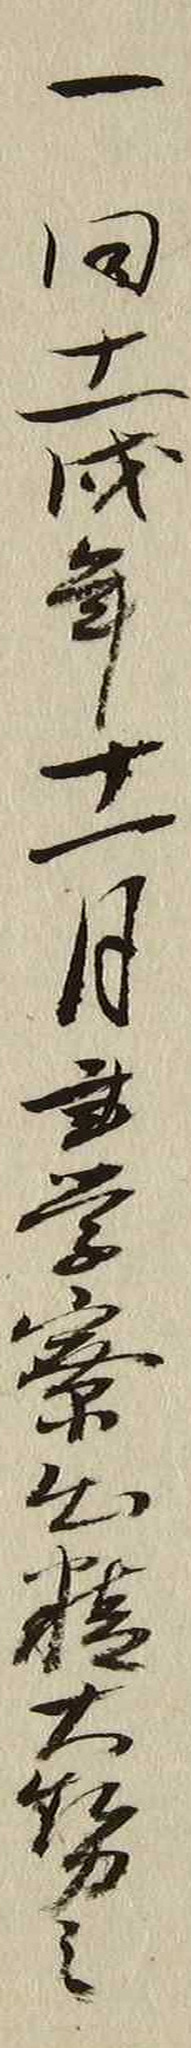一同十一戌年十一月書学寮出精大勢之
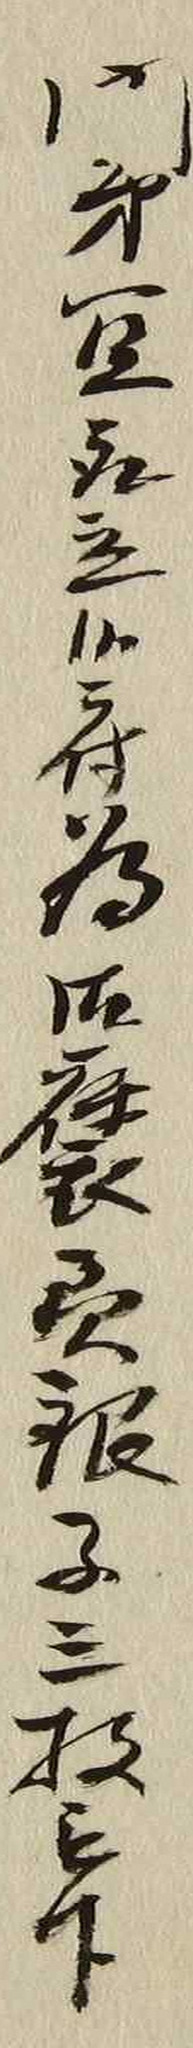門弟宜取立候ニ付為御褒美銀子三枚被下
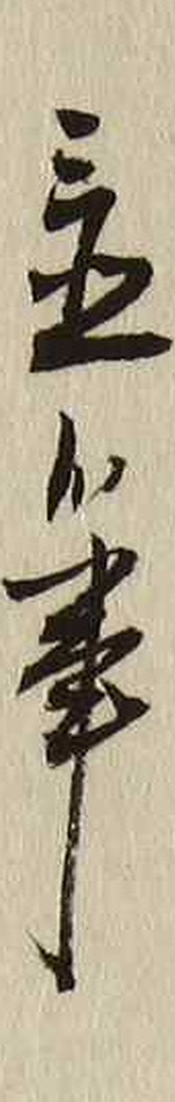置候事
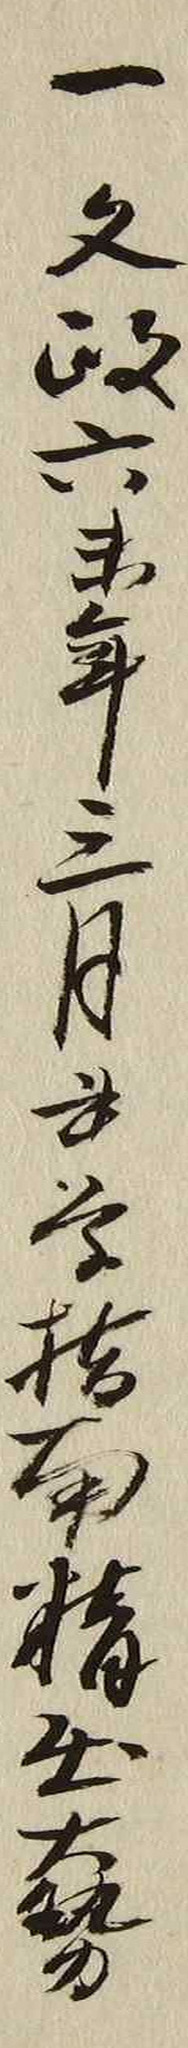一文政六未年三月書学指南精出大勢
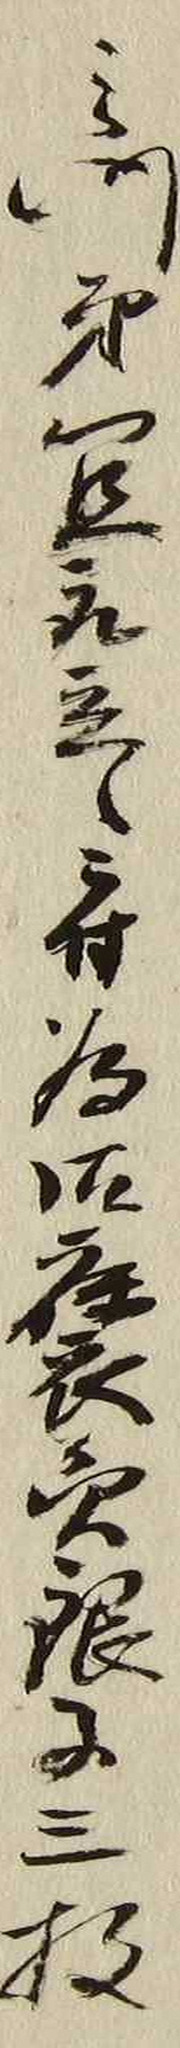之門弟宜取立候ニ付為御褒美銀子三枚
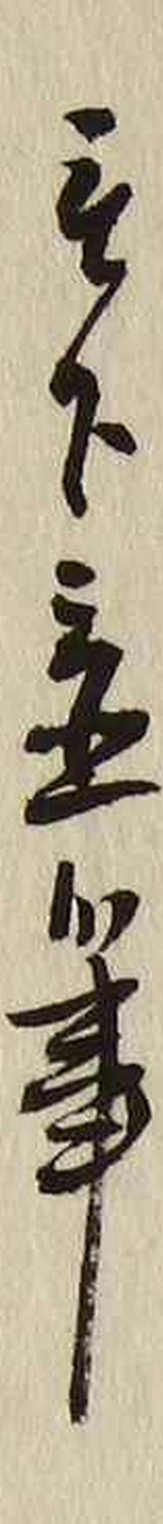被下置候事
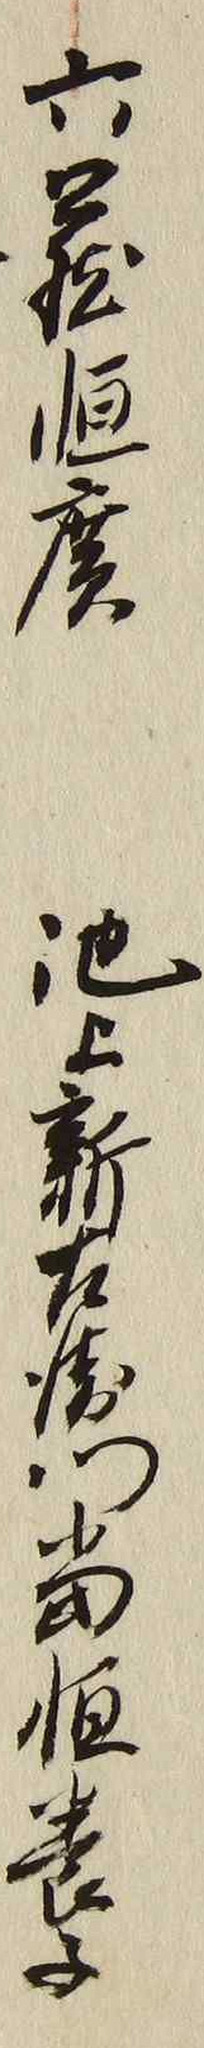六蔵恒広池上新右衛門当恒養子
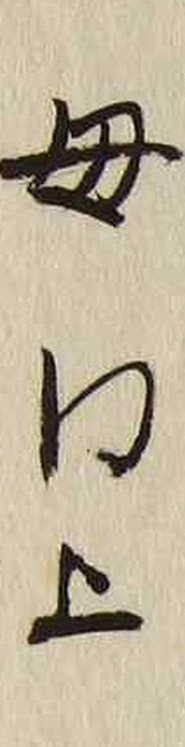母同上

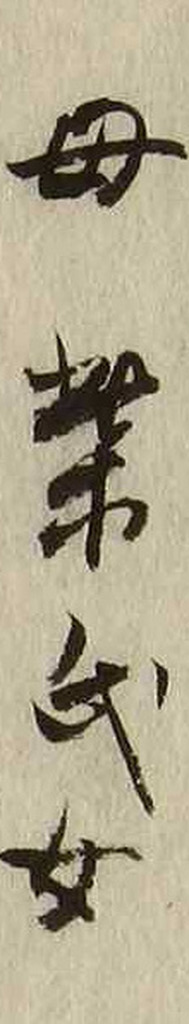母柴氏女
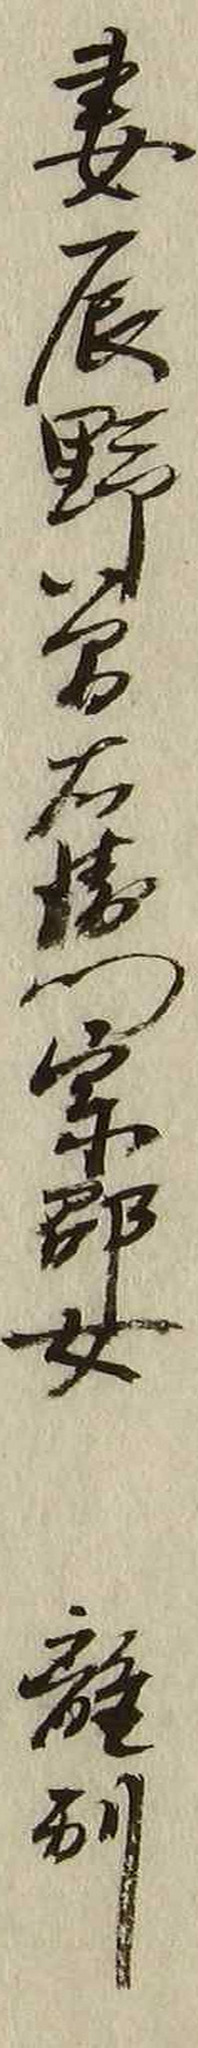妻辰野曽右衛門宗郡女離別
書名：諸士系譜　巻之345　も之部1
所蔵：会津若松市立会津図書館
